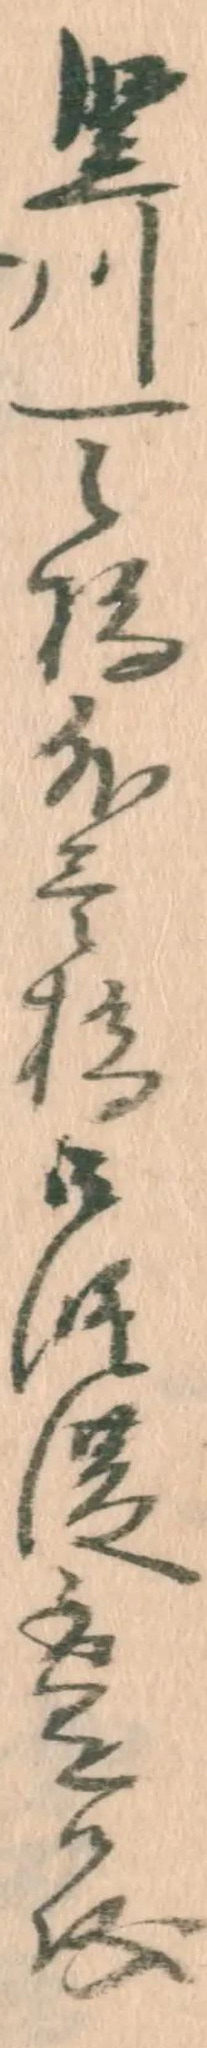竪川一之橋外壱橋御修復取懸候儀
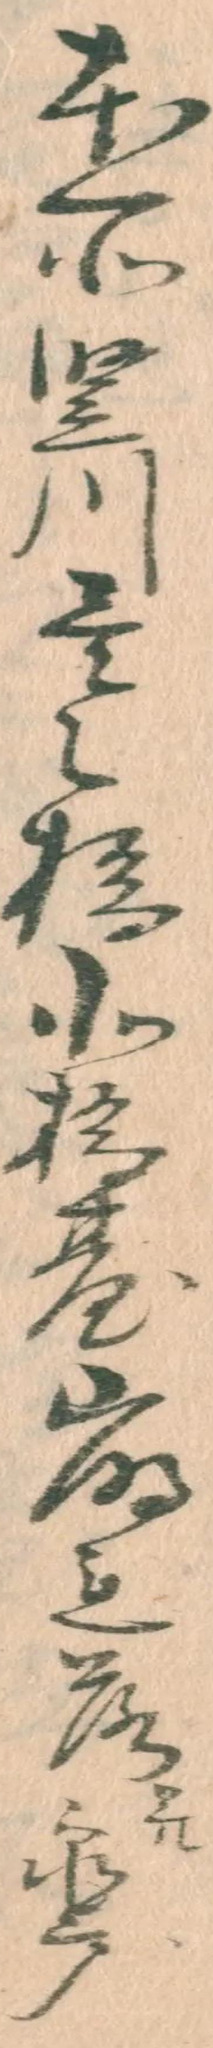本所竪川壱之橋北橋台崩れ落并亀戸
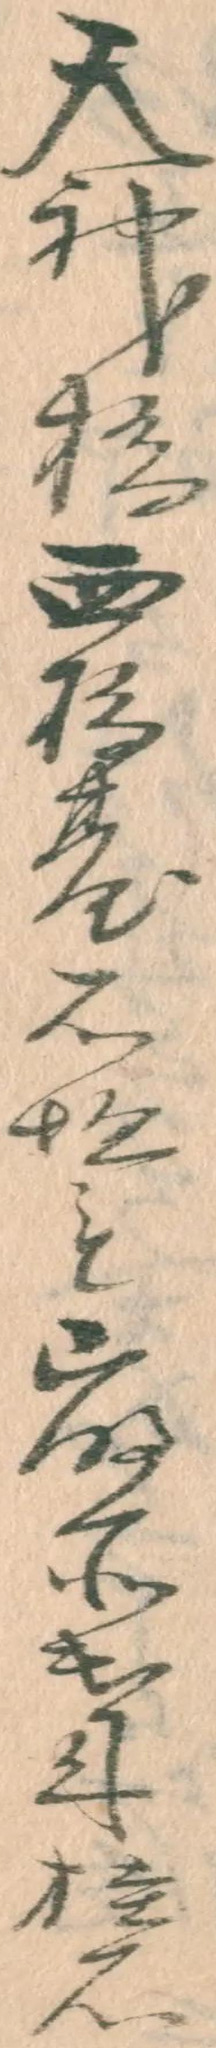天神橋西橋台石垣も崩所出来柱石
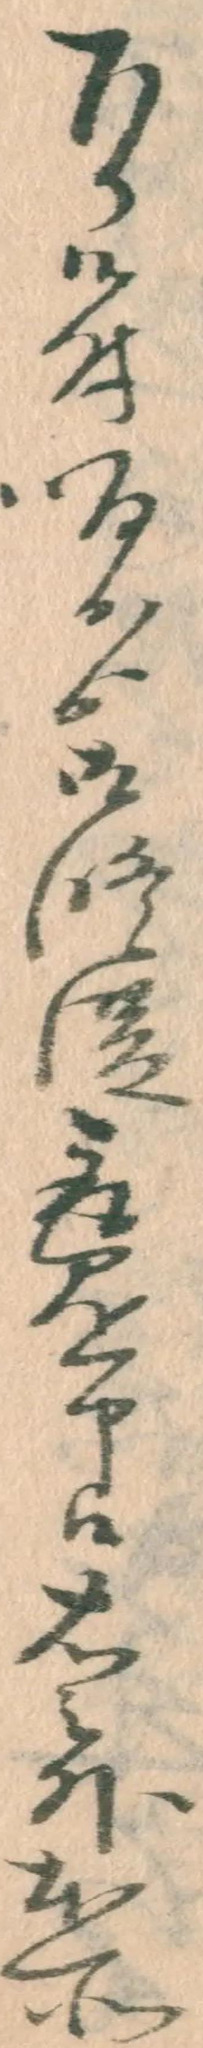下り候付明日ゟ御修復取懸申候右之外本所

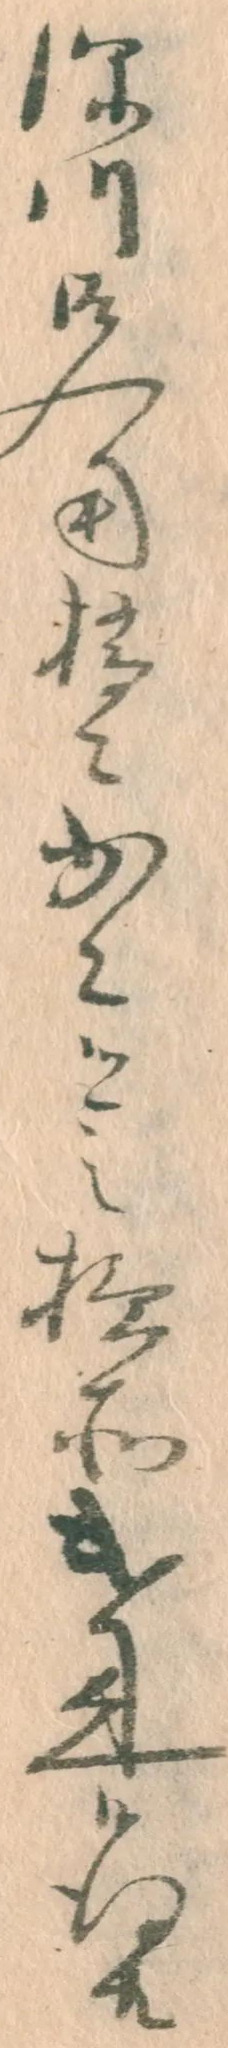深川御入用橋々少々ツヽ之損所出来候得共
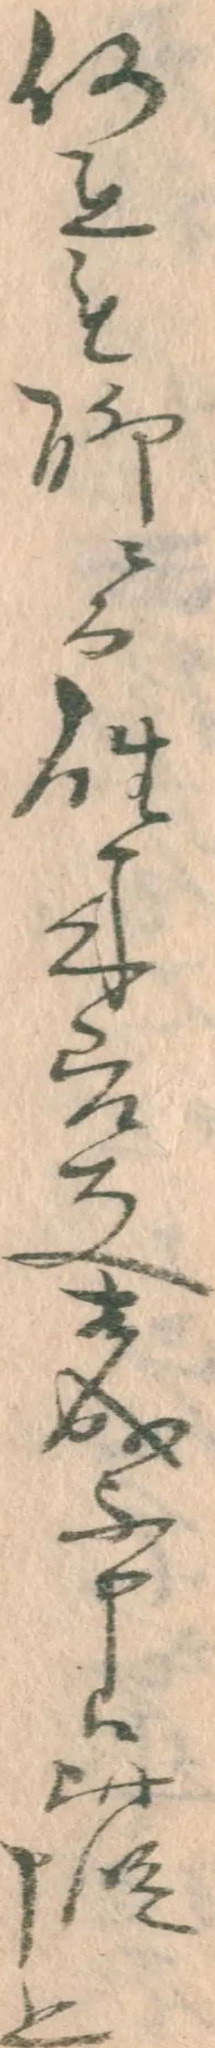何れも聊ニ而往来差支相成不申候此段申上
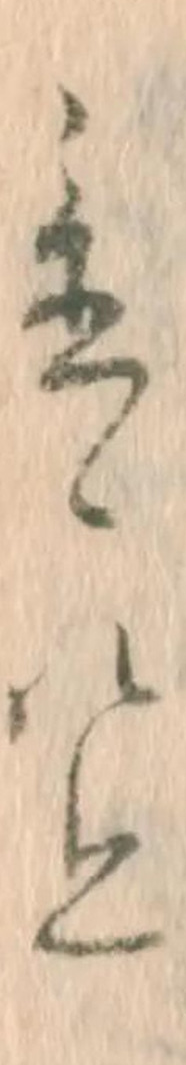置候以上
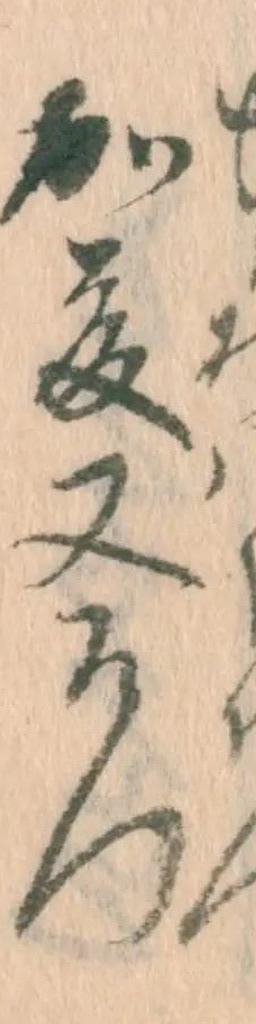加藤又左衛門
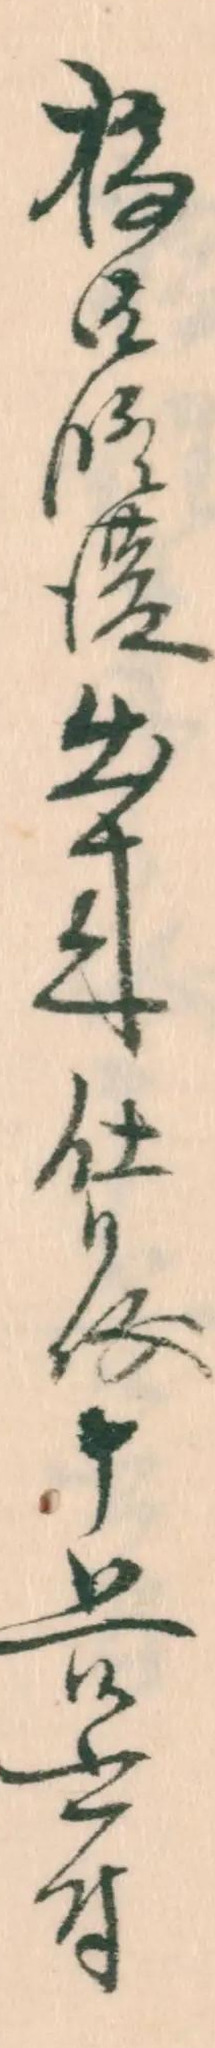│橋御修復出来仕候儀申上候書付
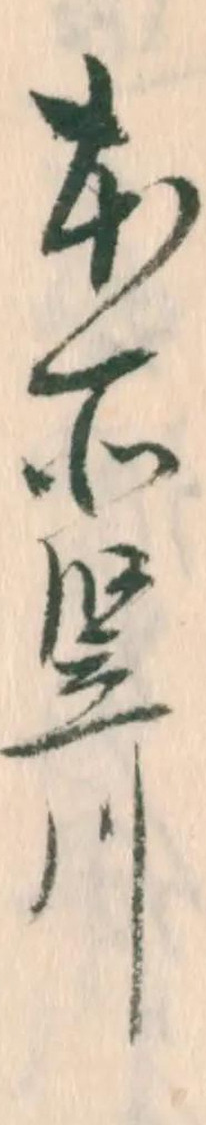本所竪川
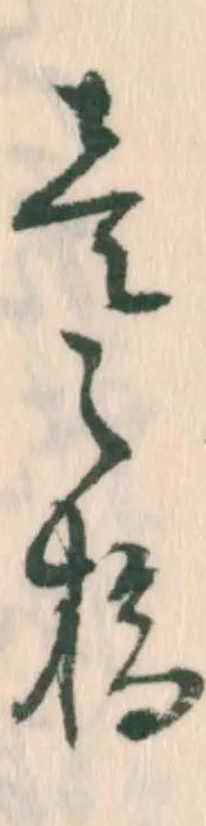壱之橋
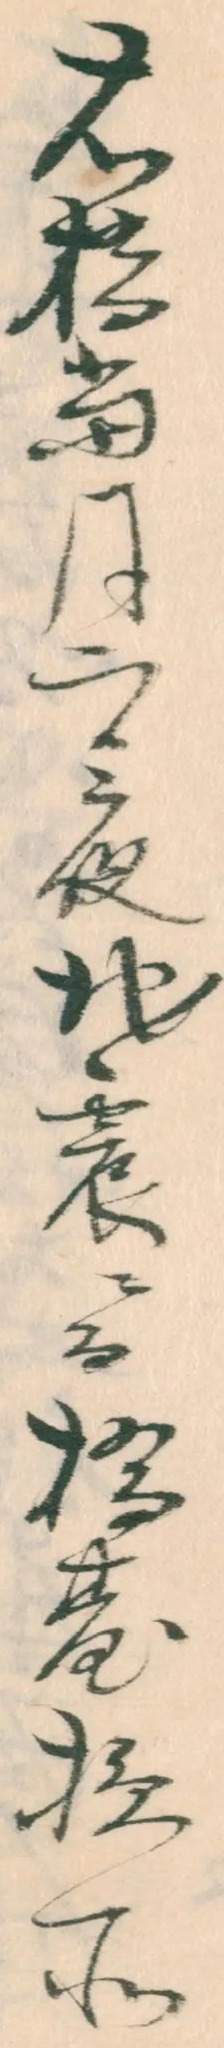右橋当月二日夜地震ニ而橋台損所
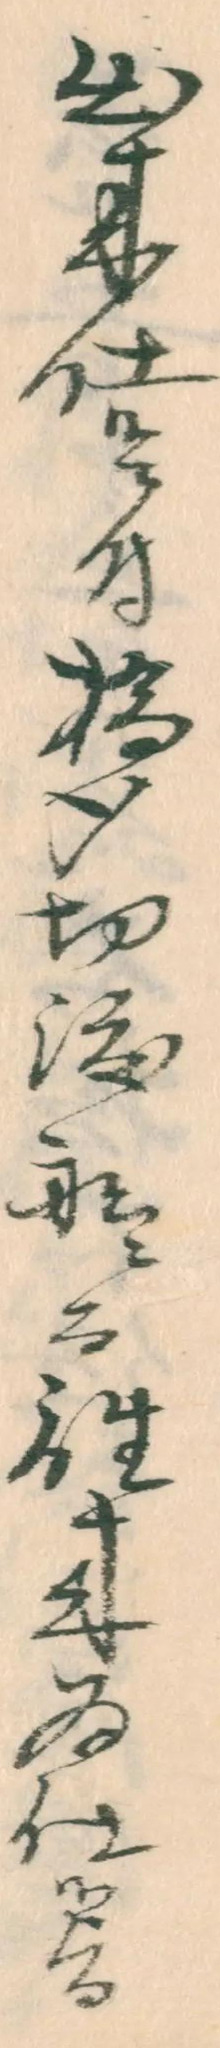出来仕候ニ付橋〆切渡船ニ而往来為仕候旨

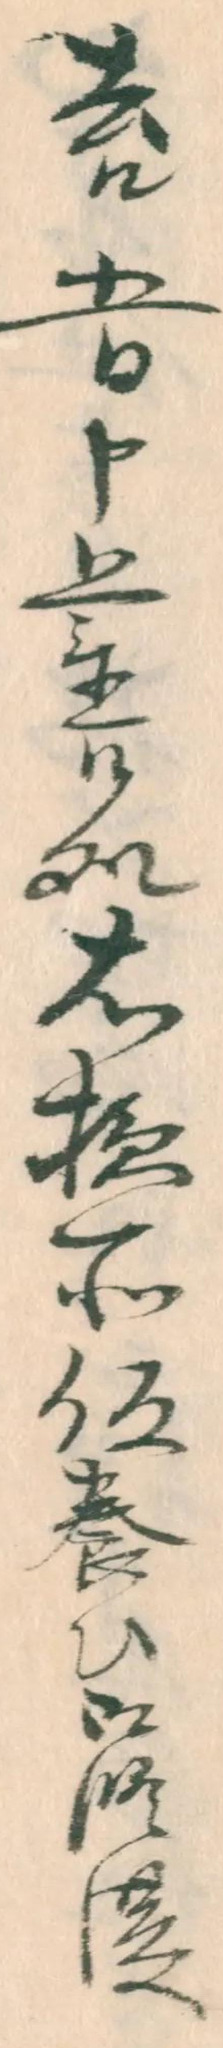去ル五日申上置候処右損所仮養ひ御修復
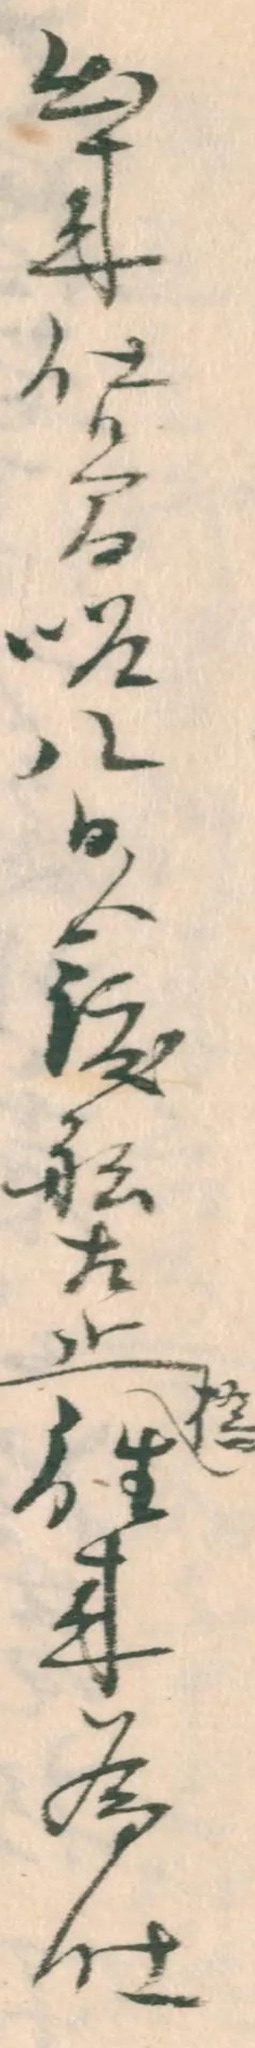出来仕候間昨八日ゟ渡船相止橋往来為仕
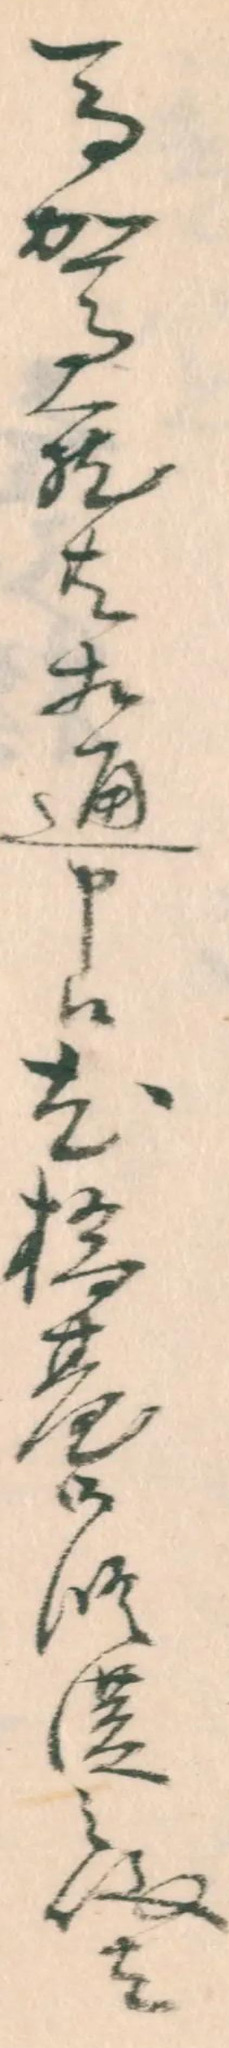馬駕籠共相通申候尤橋台御修復之儀は
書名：地震災書留 2巻. [1] 内表紙に「地震災書留　安政二卯年　但本所深川御用屋敷地代免除調」とあり
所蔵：国立国会図書館 National Diet Library, JAPAN
